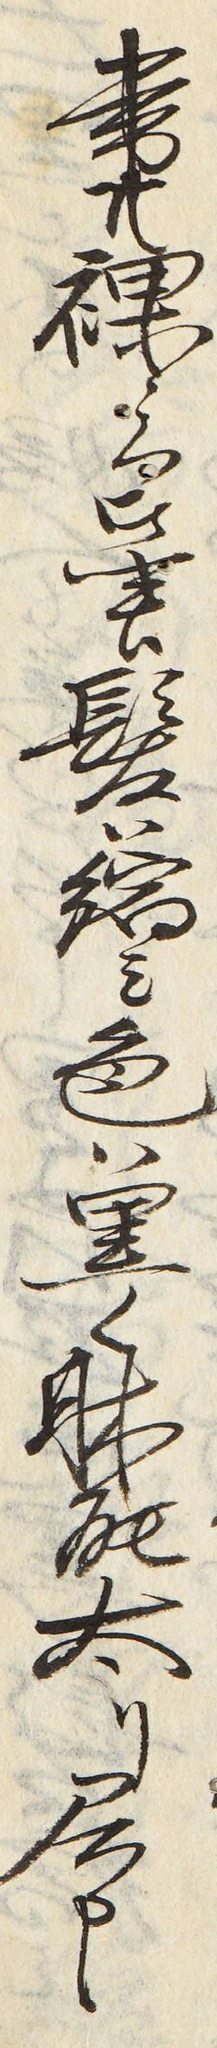常共裸ニ而御坐候髪は縮ミ色は黒く躰能太り居申候

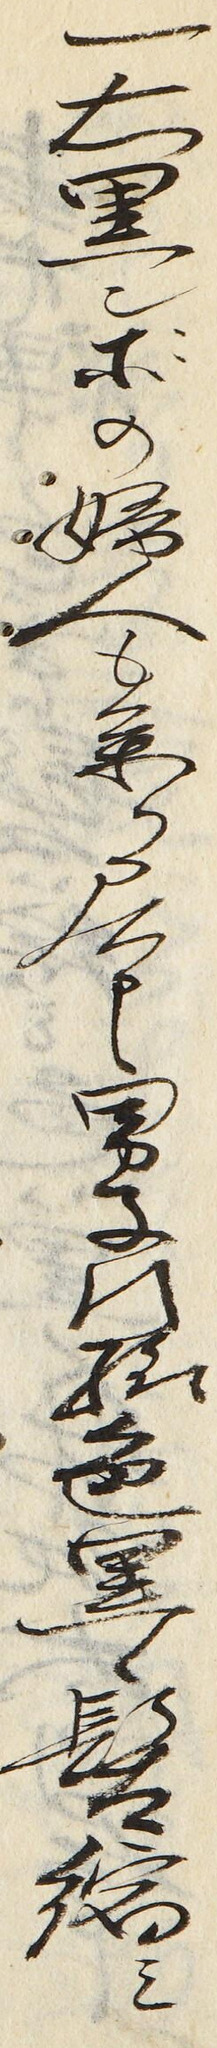一右黒ンボの婦人も参り居申候男子同様色黒く髪縮ミ
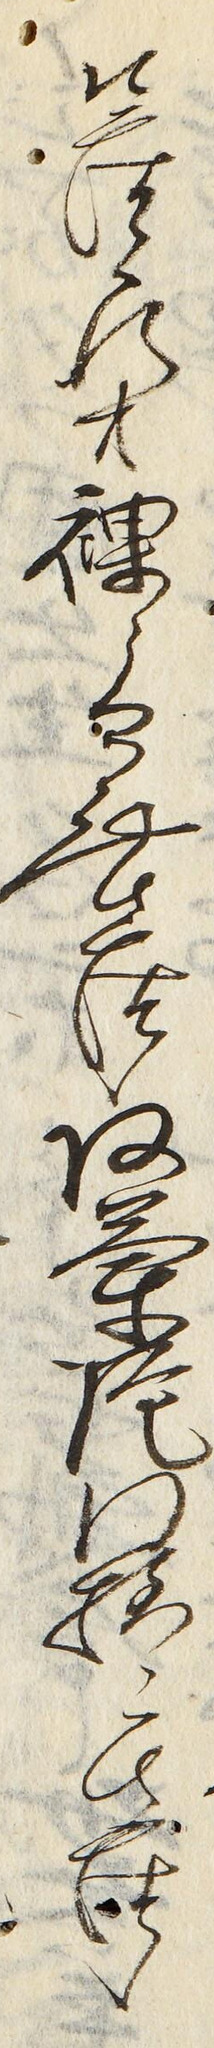御座候得共裸ニ而無御座候阿蘭陀同様ニ御座候
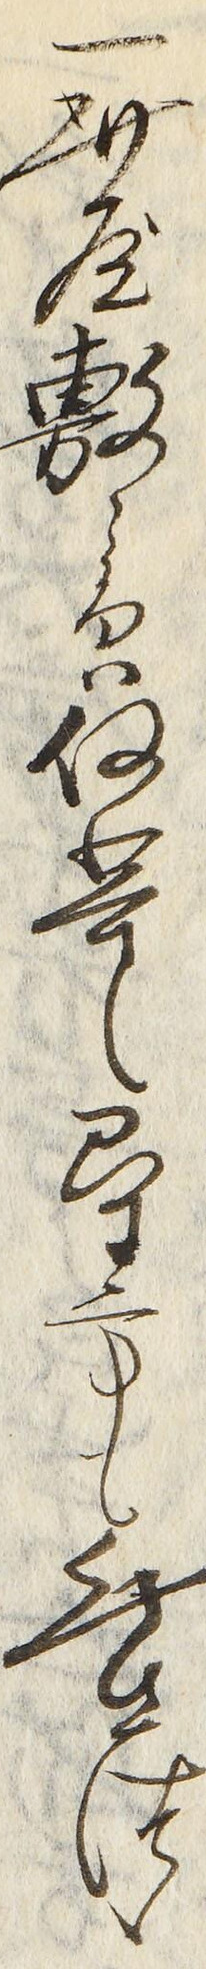一此屋敷ニ而は何等之尋方も無御座候
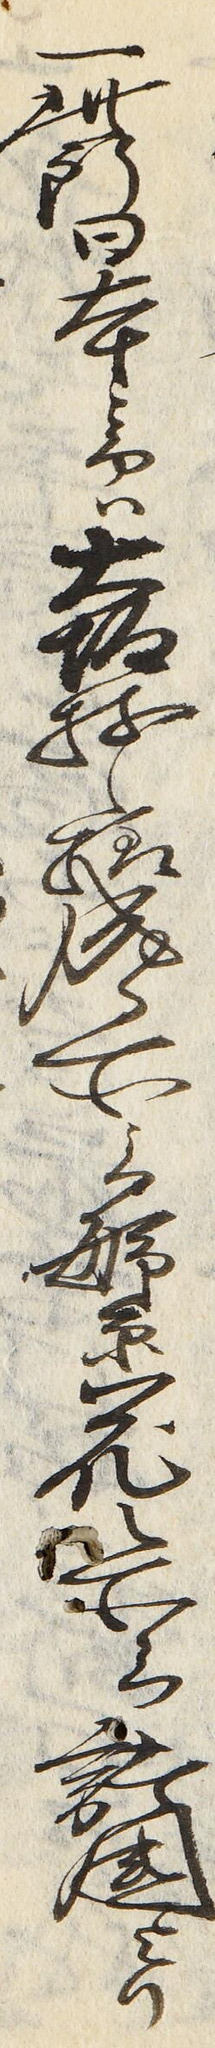一此所日本ニ而は大坂抔之様成候所ニ而繫花之所ニ而諸国より
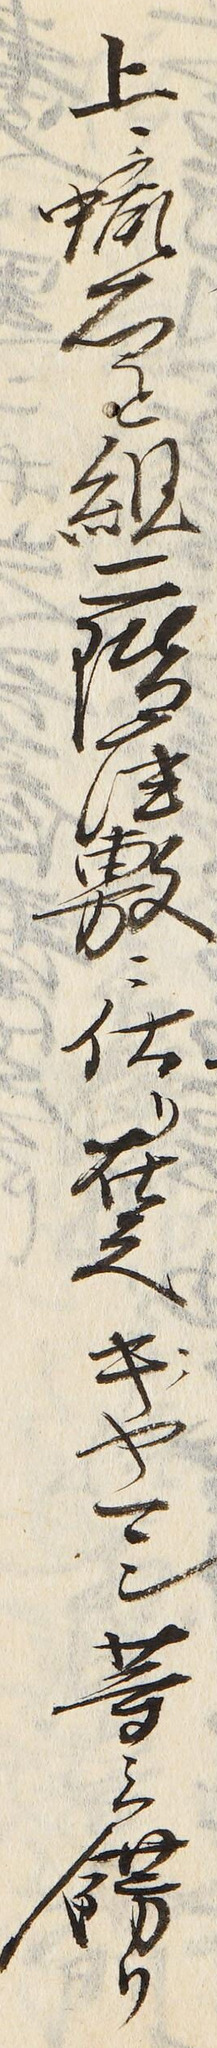上へ蠟石を組二階座敷ニ仕り在之ギヤマン等之錺り
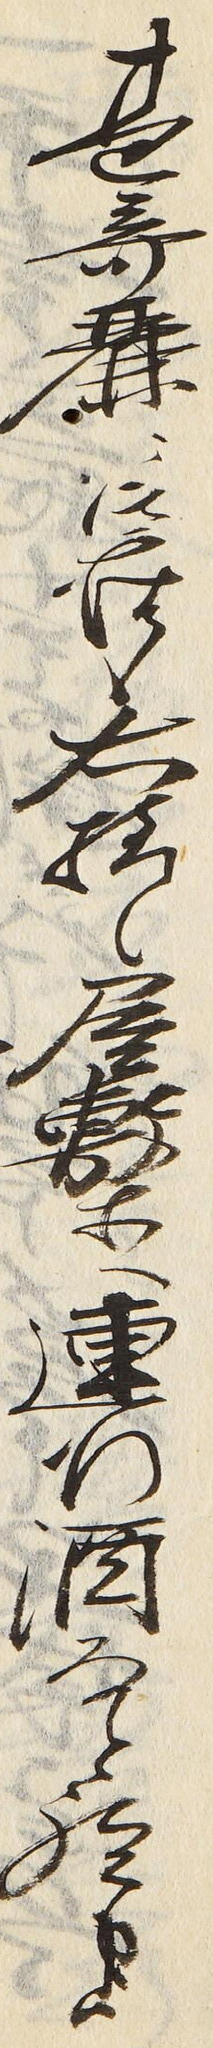甚奇麗ニ御座候右様之屋敷等へ連行酒なと給申候
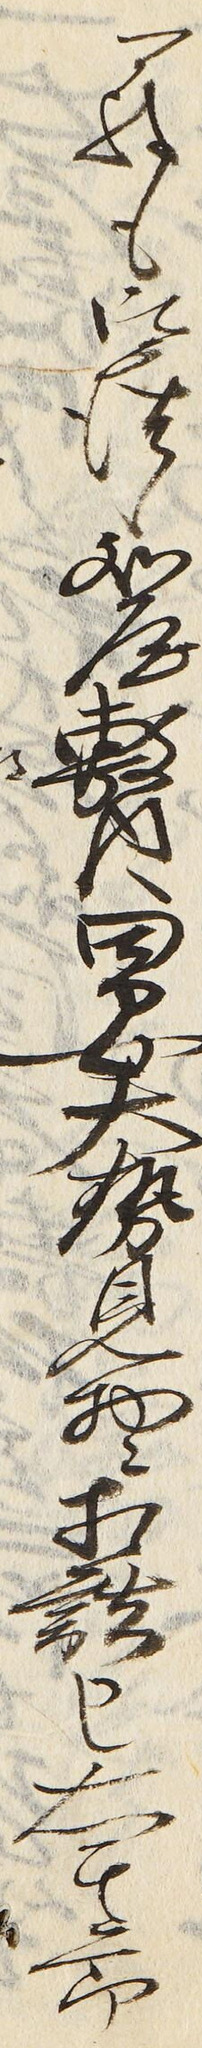義も御座候処屋敷内へ男女大勢見物ニ相詰申候右其節
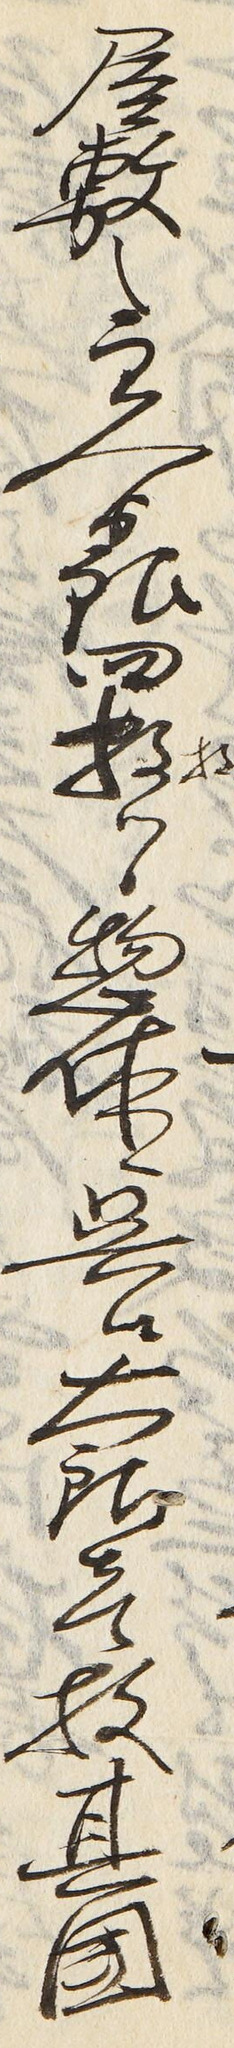屋敷之主人ゟ銀四枚ツヽ惣体へ呉候右銀壱枚其国
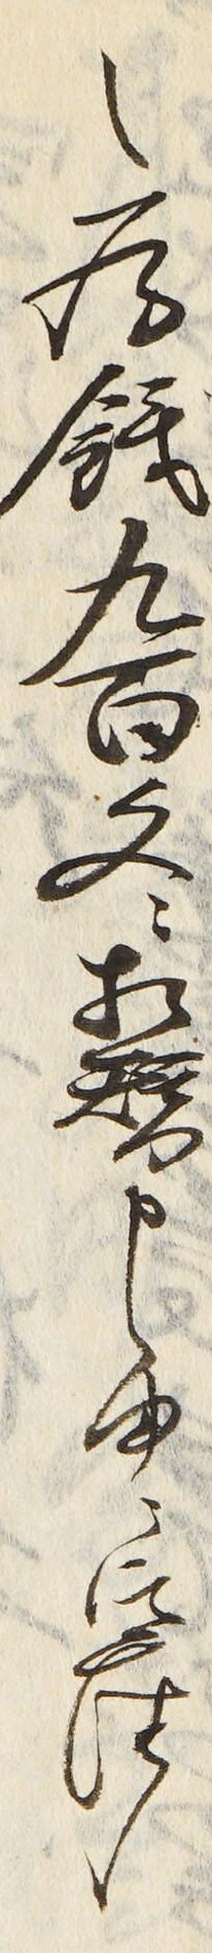之為銭九百文ニ相替申候由ニ御座候
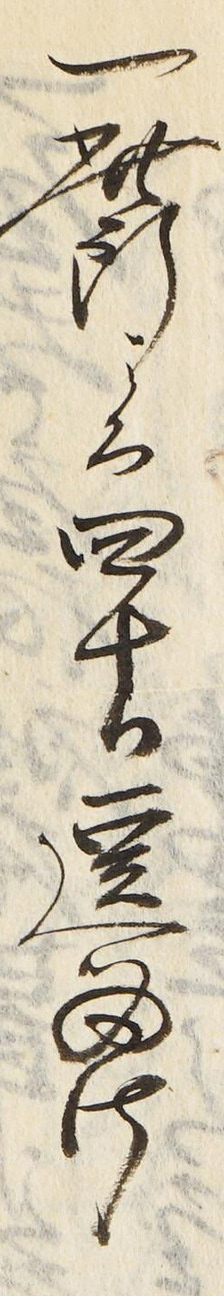一此所ニ而四十日逗留仕候
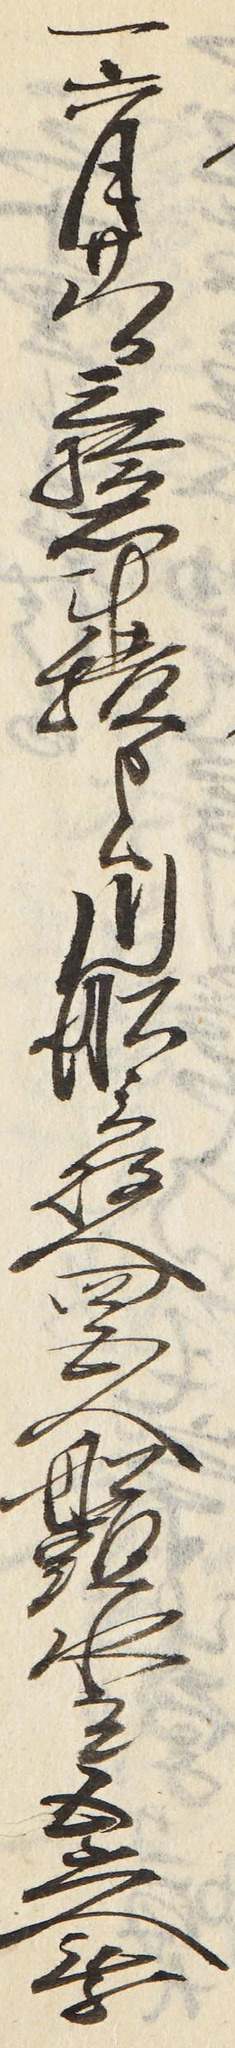一六月廿八日三拾石計積申候川船ニ而役人四五人船頭水主五六人乗
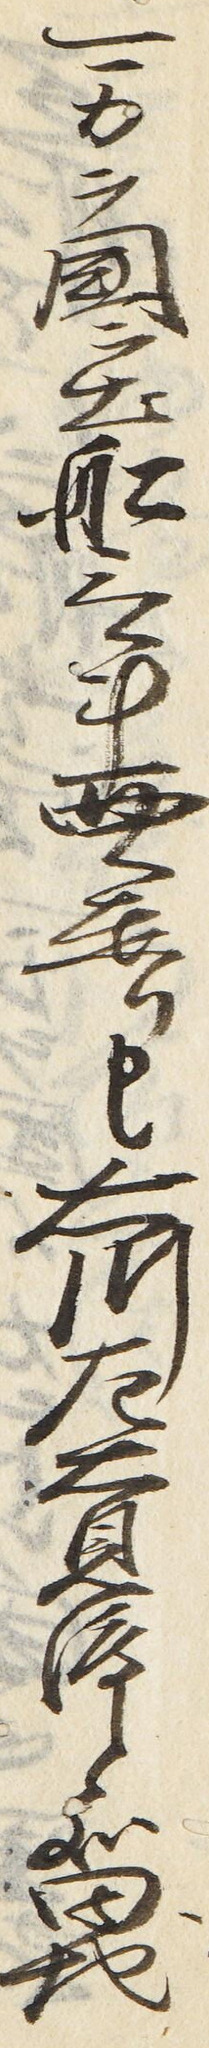マカラ国ニ出船三日計西へ走り申候右川左右見渡し候処田地
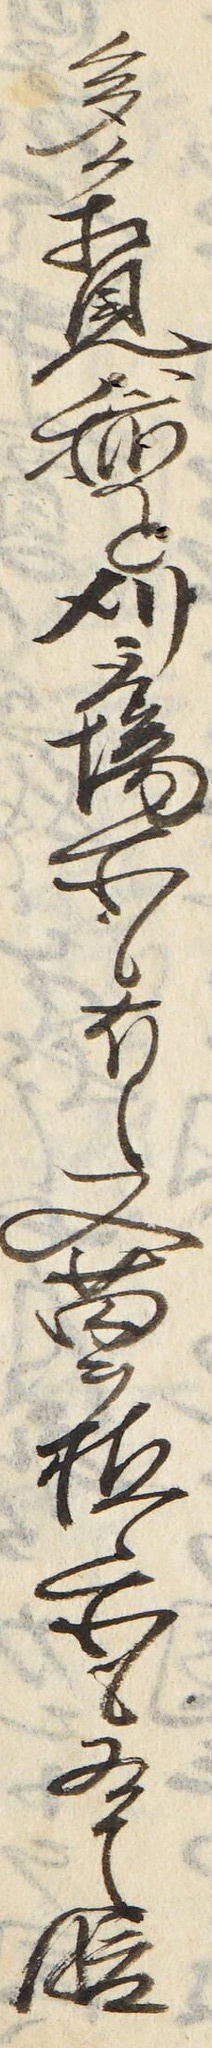多ク相見へ稲を刈取場所も有之又苗を植候所も有之暖

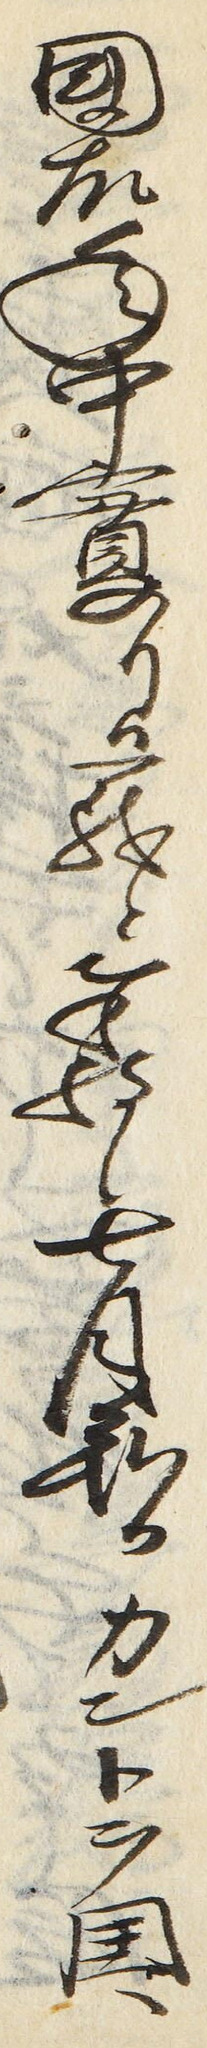国故年中実り候義と奉存候七月朔日カントウ国へ
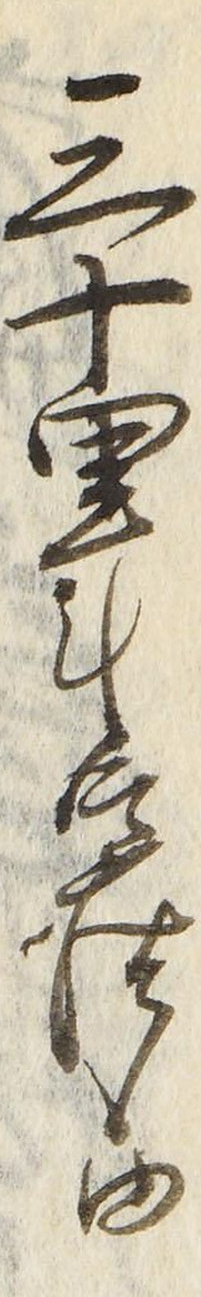三十里計御座候由
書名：漂流記
